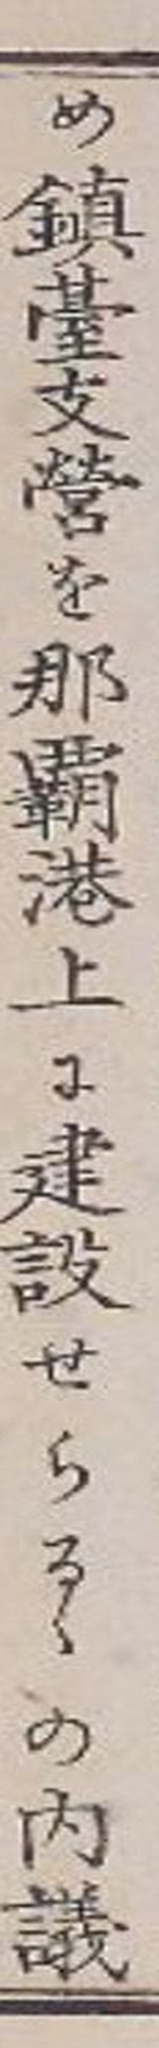め鎮台支営を那覇港上に建設せらるゝの内議
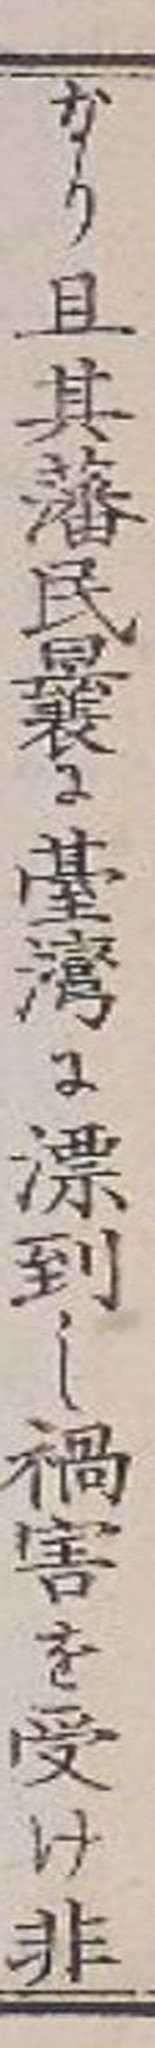なり且其藩民曩に台湾に漂到し禍害を受け非
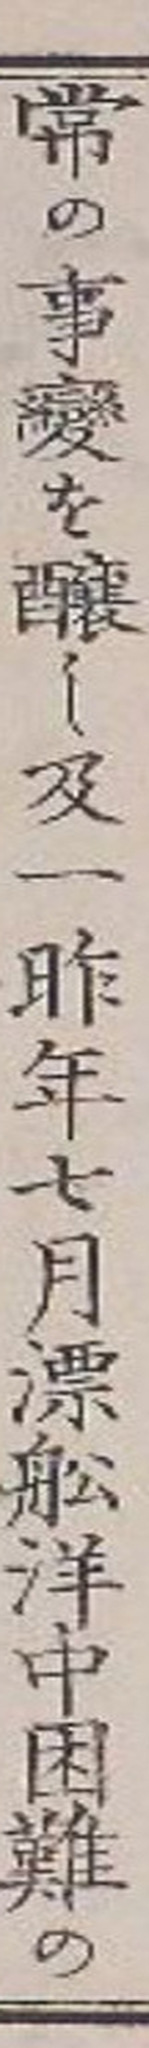常の事変を醸し及一昨年七月漂船洋中困難の
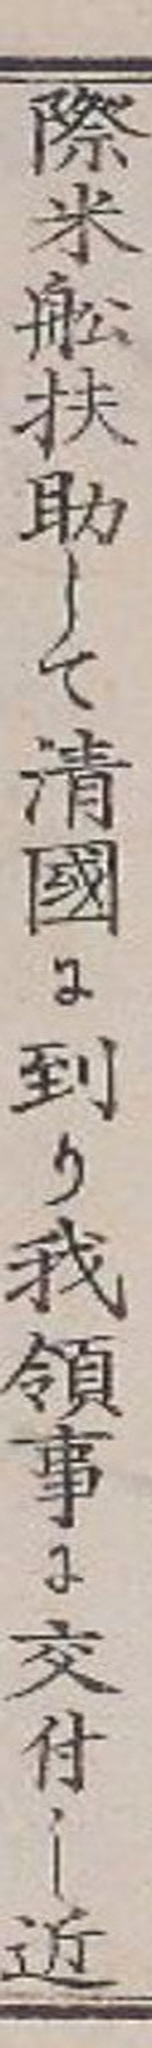際米船扶助して清国に到り我領事に交付し近
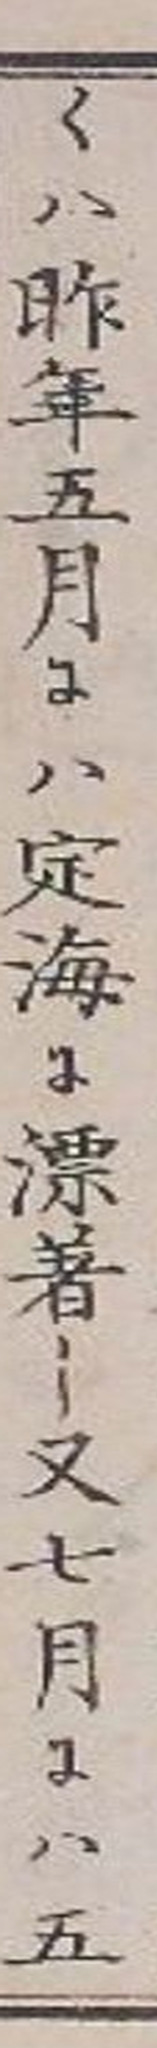くは昨年五月には定海に漂着し又七月には五

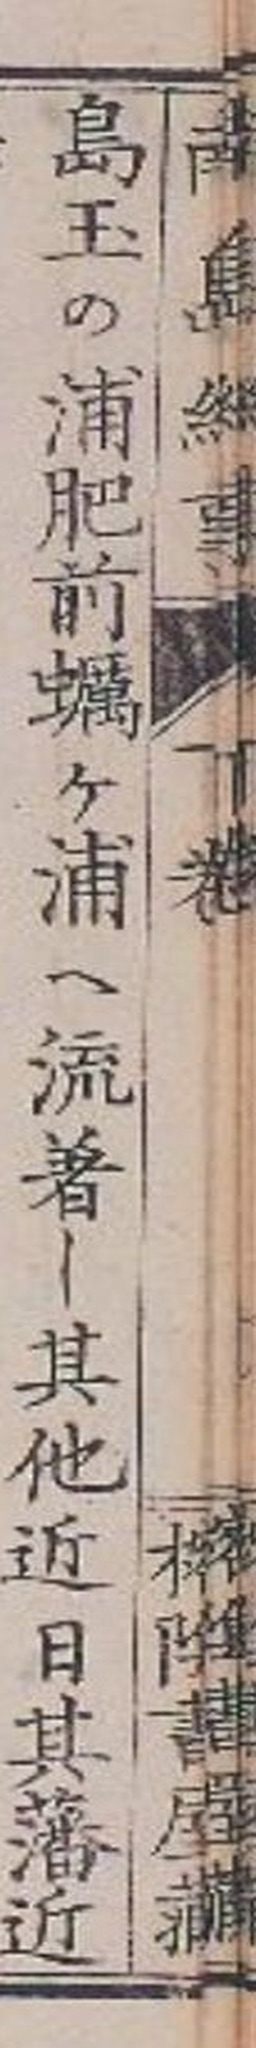島玉の浦肥前蠣ケ浦へ漂着し其他近日其藩近
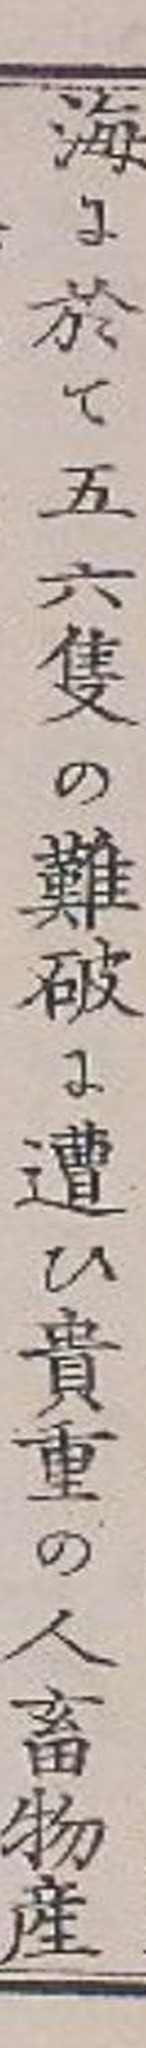海に於て五六隻の難破に遭ひ貴重の人畜産物
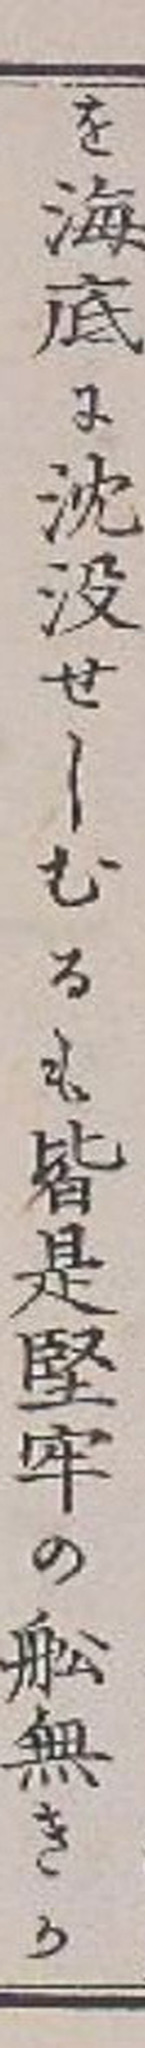を海底に沈没せしむるも皆是堅牢の船無きか
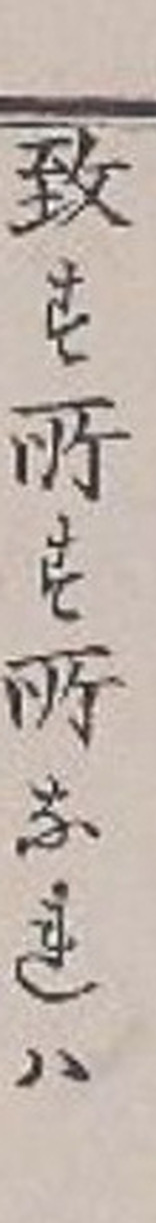致す所す所なれは
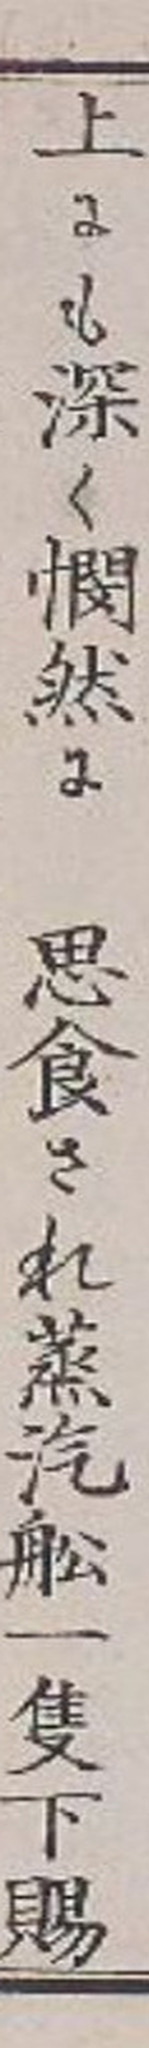上にも深く憫然に思食され蒸気船一隻下賜
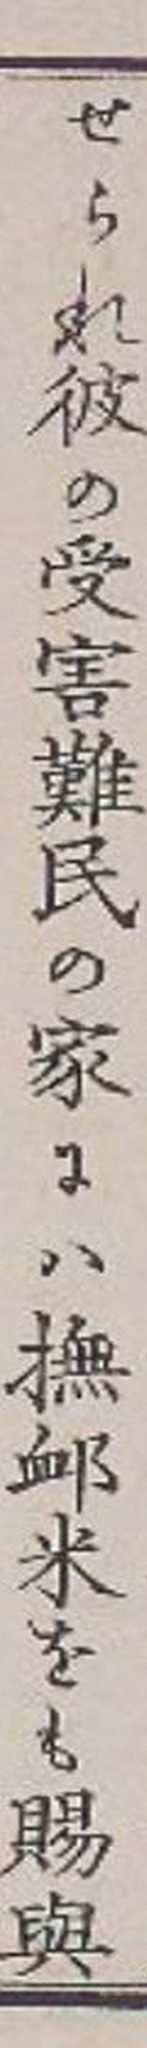せられ彼の受害難民の家には撫卹米をも賜興
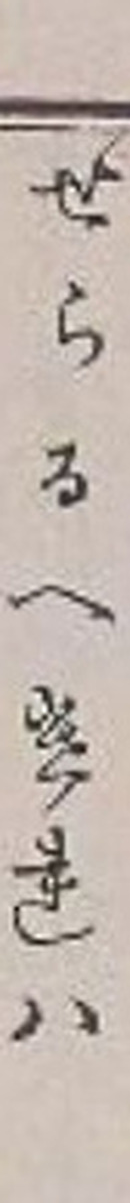せらるへけれは
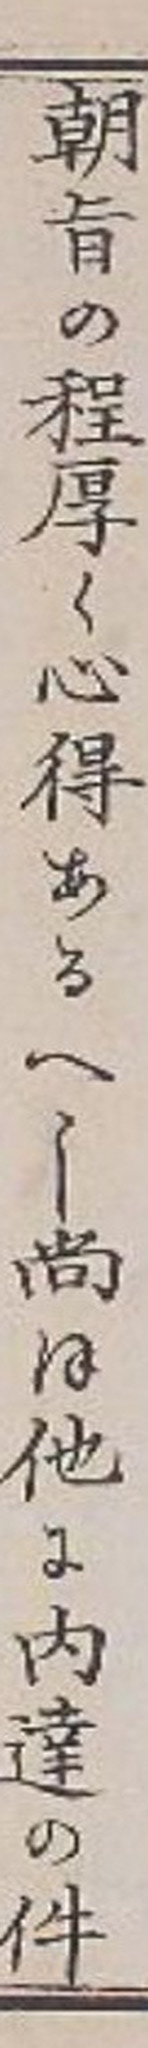朝旨の程厚く心得あるへし尚ほ他に内達の件
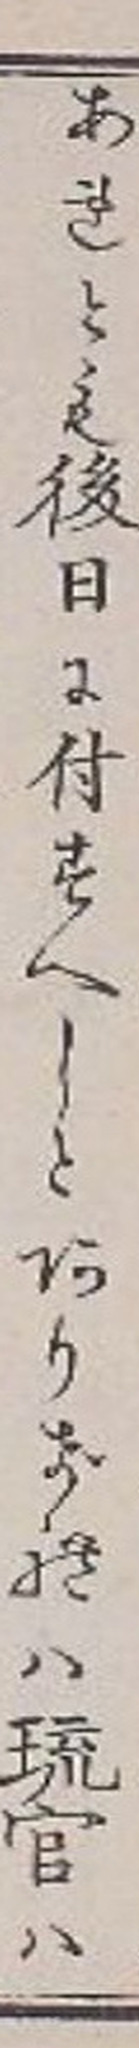あれとも後日に付すへしとありけれは琉官は
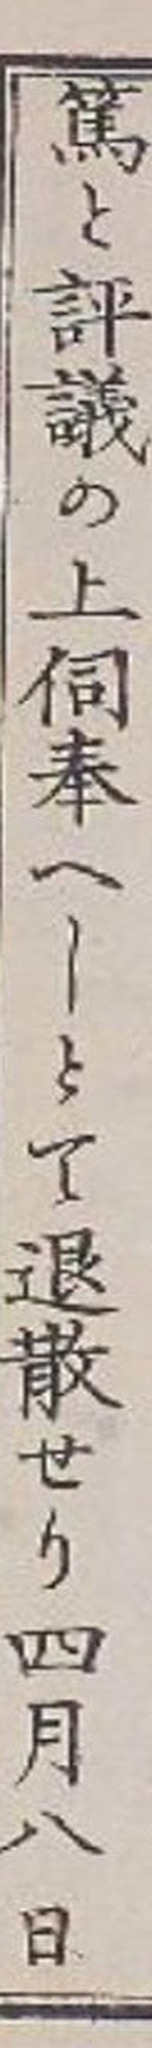篤と評議の上伺奉へしとて退散せり四月八日
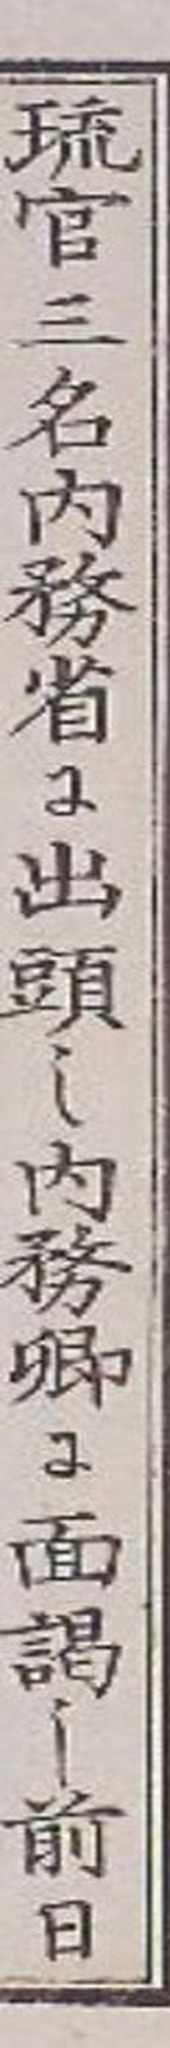琉官三名内務省に出頭し内務卿に面謁し前日
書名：南島紀事 下
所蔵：University of the Ryukyus Library
